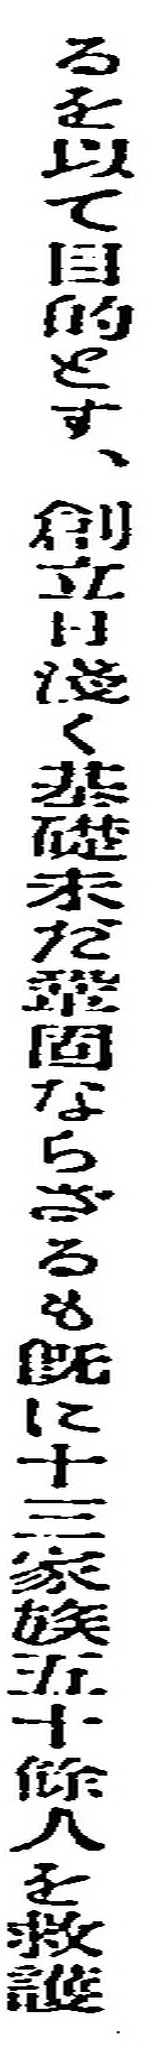るを以て目的とす、創立日淺く基礎未だ鞏固ならざるも旣に十三家族五十餘人を救護
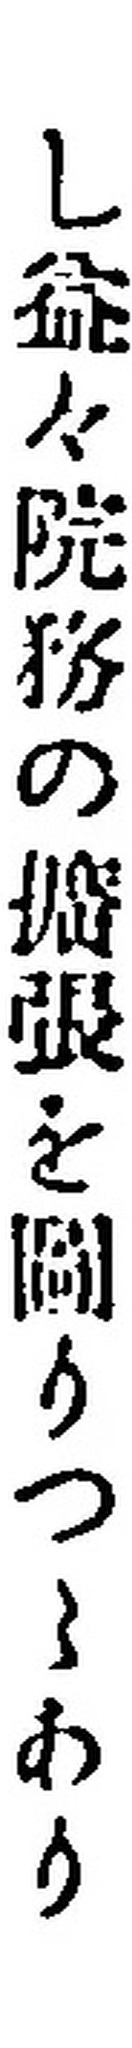し益々院務の擴張を圖りつゝあり
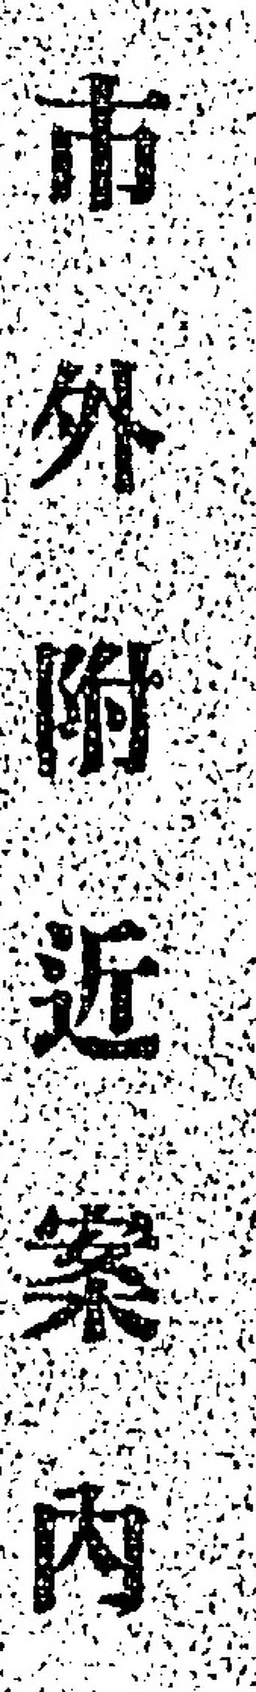市外附近案内

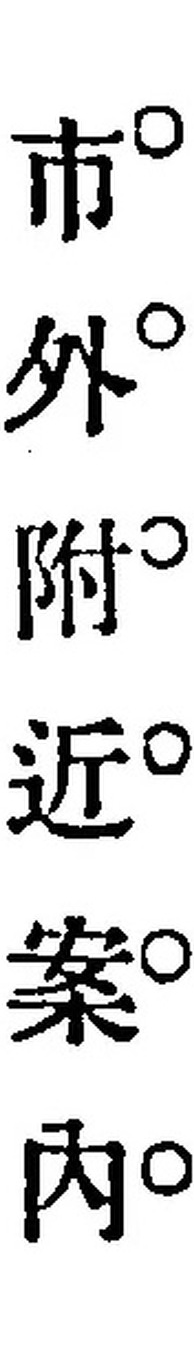市外附近案内
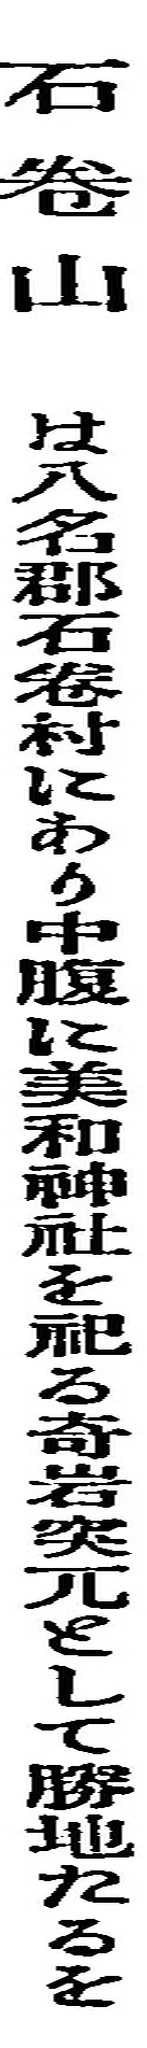石卷山は八名郡石卷村にあり中腹に美和神社を祀る奇岩突兀として勝地たるを
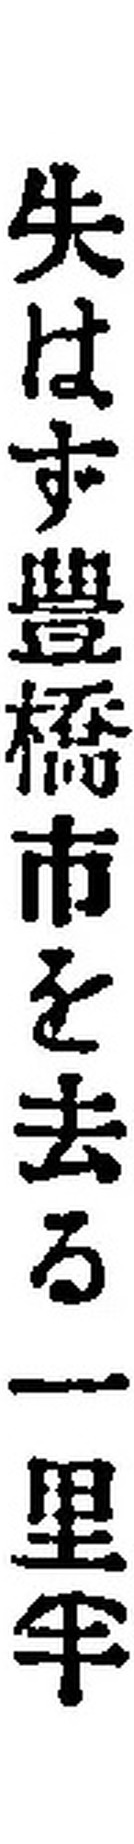失はず豊橋市を去る一里半
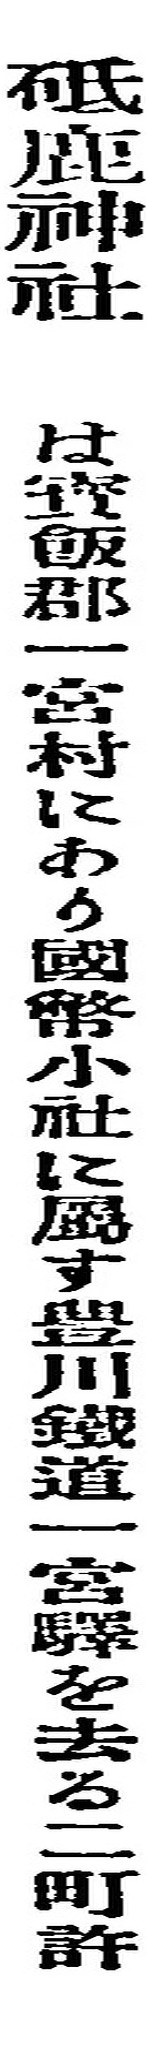砥鹿神社は寶飯郡一宮村にあり國幣小社に属す豊川鐵道一宮驛を去る二町許
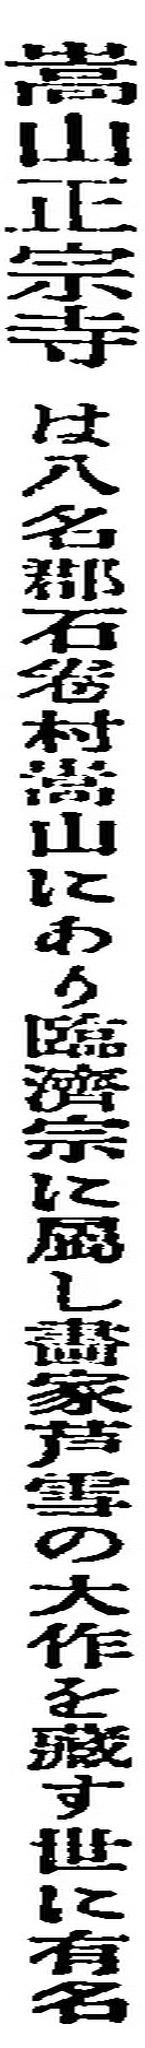嵩山正宗寺は八名郡石卷村嵩山にあり臨濟宗に屬し畵家芦雪の大作を藏す世に有名
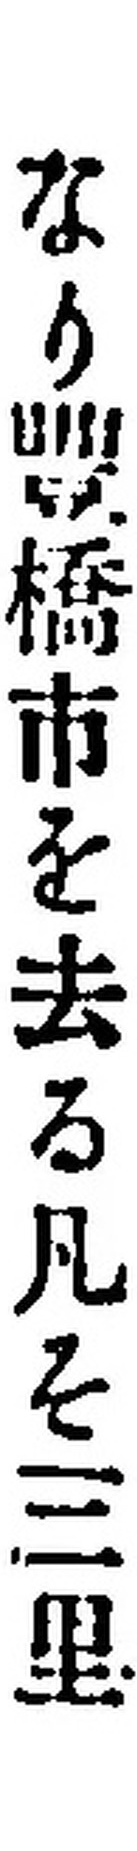なり豐橋市を去る凡そ三里
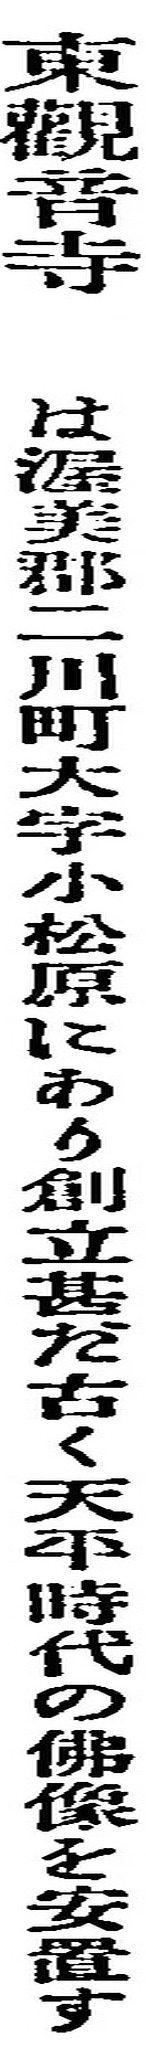東觀音寺は渥美郡二川町大字小松原にあり創立甚だ古く天平時代の佛像を安置す
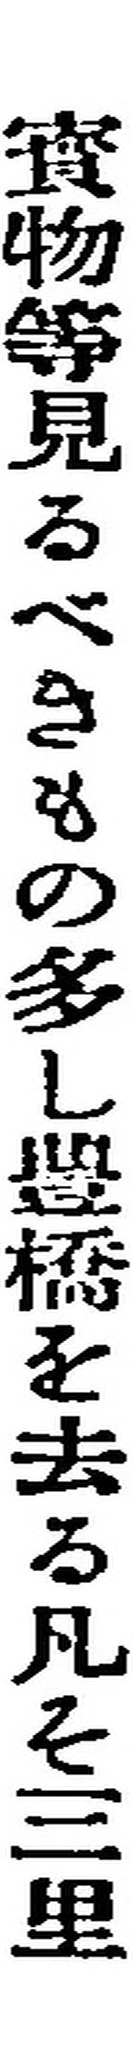寶物等見るべきもの多し豊橋を去る凡そ三里
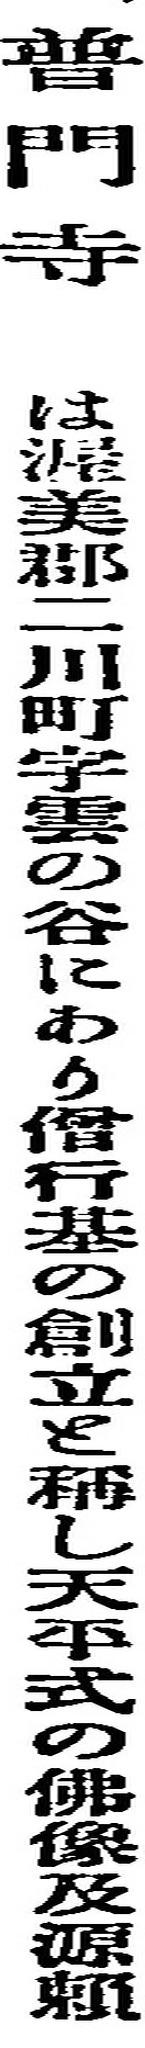普門寺は渥美郡二川町字雲の谷にあり僧行基の創立と稱し天平式の佛像及源賴
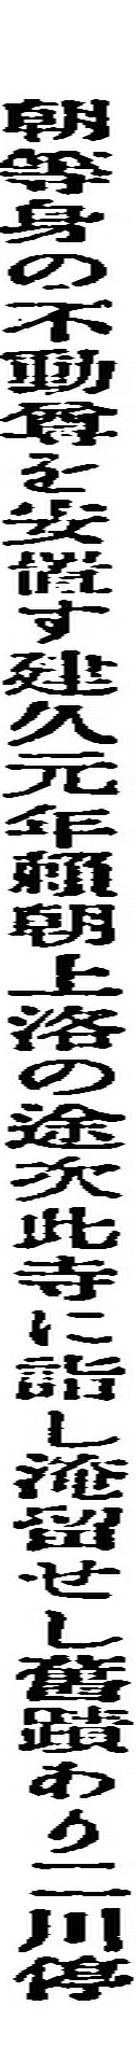朝等身の不動尊を安置す建久元年賴朝上洛の途次此寺に詣し淹留せし舊蹟あり二川停

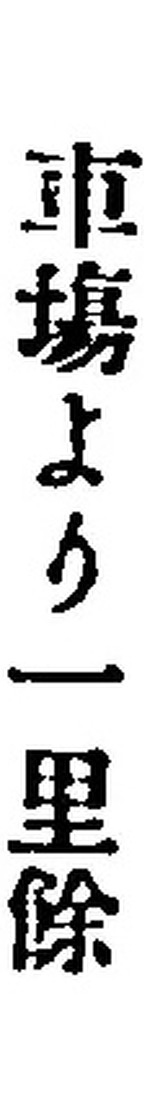車場より一里餘
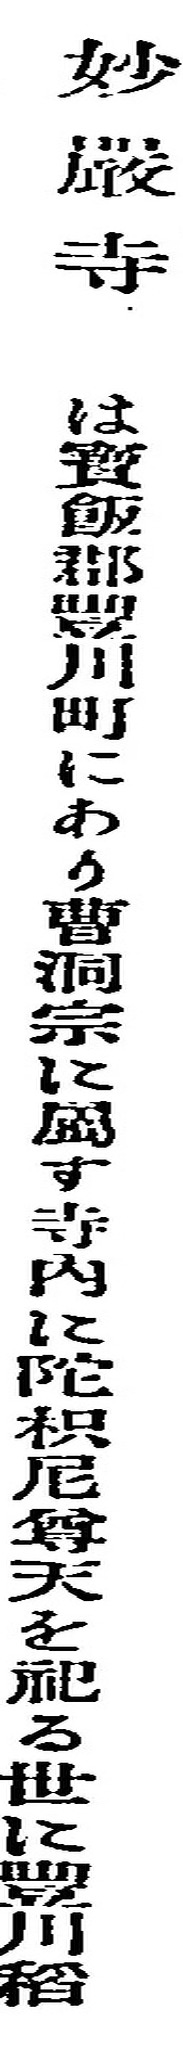妙嚴寺は寶飯郡豐川町にあり曹洞宗に屬す寺内に陀枳尼尊天を祀る世に豐川稻
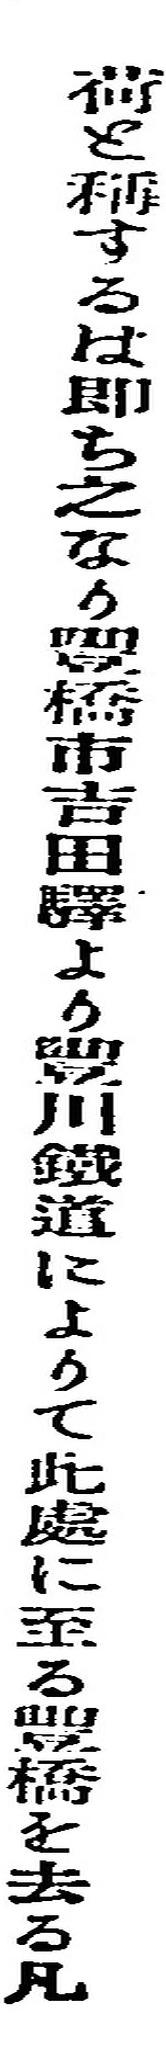荷と稱するは即ち之なり豐橋市吉田驛より豐川鐵道によりて此處に至る豐橋を去る凡
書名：豊橋志要
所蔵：国立国会図書館 National Diet Library, JAPAN
